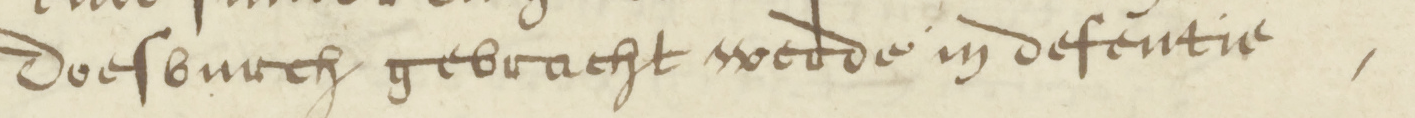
Doesburch gebracht werde in defentie.
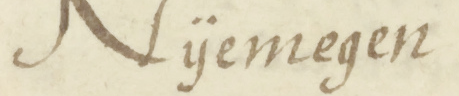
Nijemegen
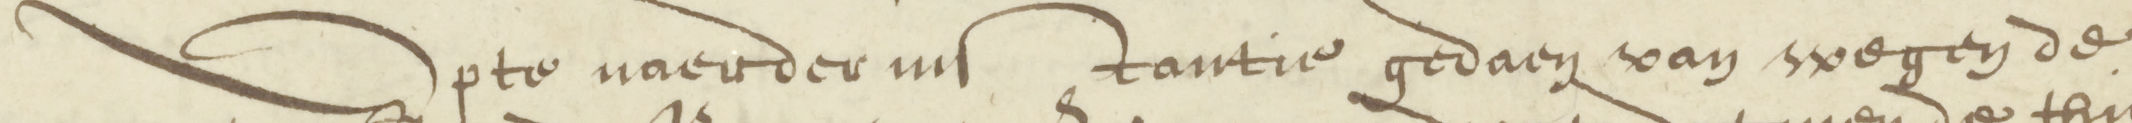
Opte naerder instantie gedaen van wegen de
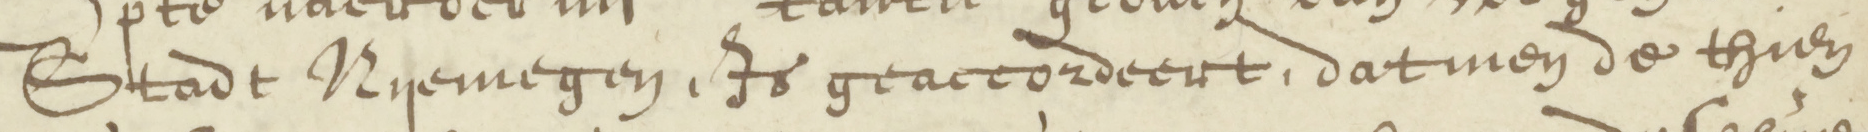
Stadt Nyemegen, Is geaccordeert, dat men de thien
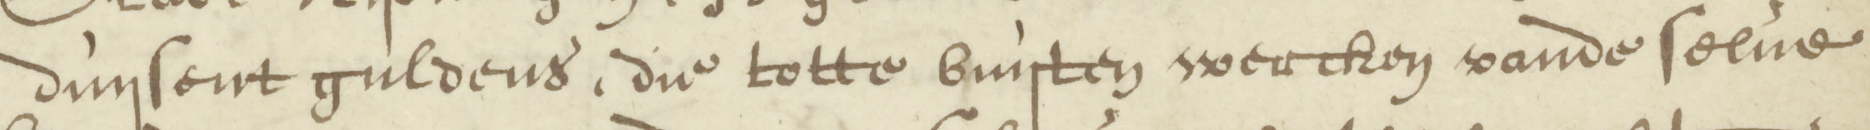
duysent guldens, die totte buyten wercken vande selue
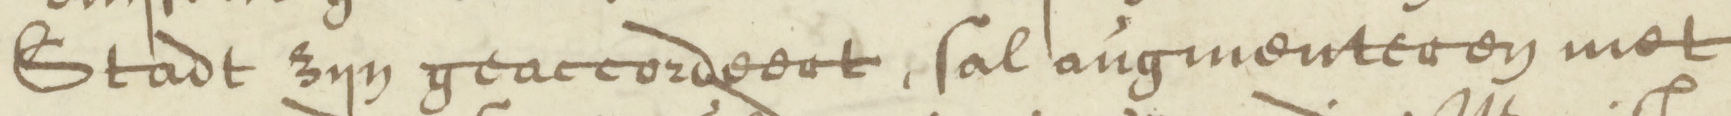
Stadt zijn geaccordeert, sal augmenteren met
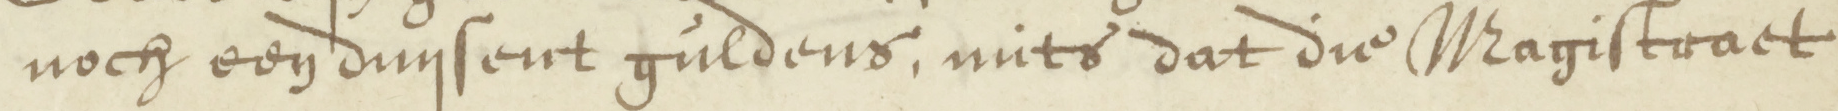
noch een duysent guldens, mits dat die Magistraet
